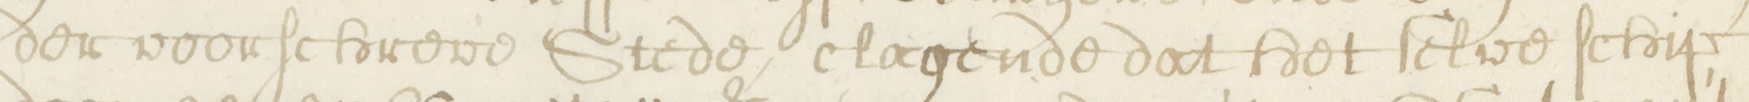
der voorschreve Stede, clagende dat het selve schip
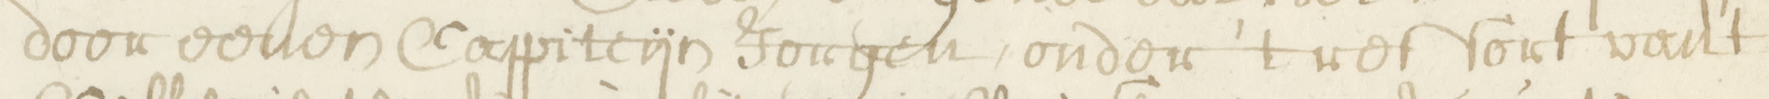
door eenen Cappiteijn Jorgen, onder 't ressort van't
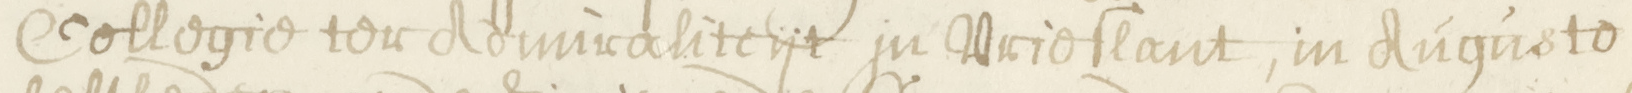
Collegie ter Admiraliteijt in Vrieslant, in Augusto
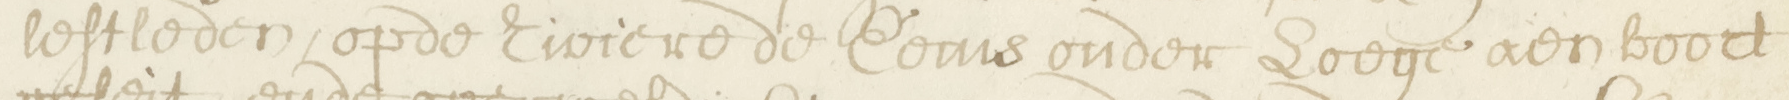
lestleden, opde riviere de Eems onder Loege aen boort
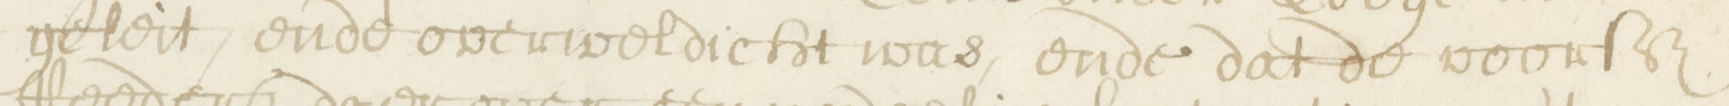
geleit, ende overweldicht was, ende dat de voorsz
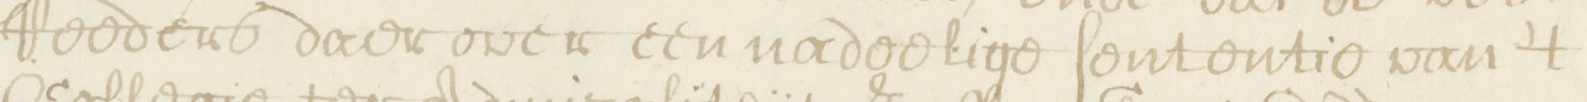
Reeders daer over een nadeelige sententie van't
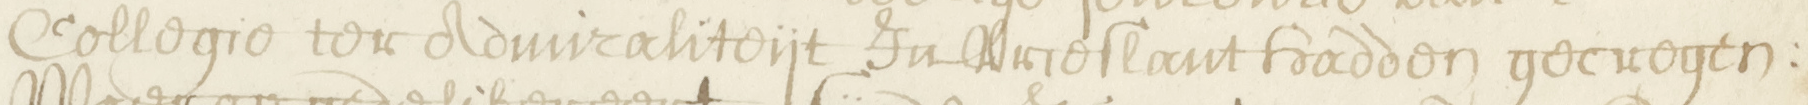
Collegie ter Admiraliteijt In Vrieslant hadden gecregen:
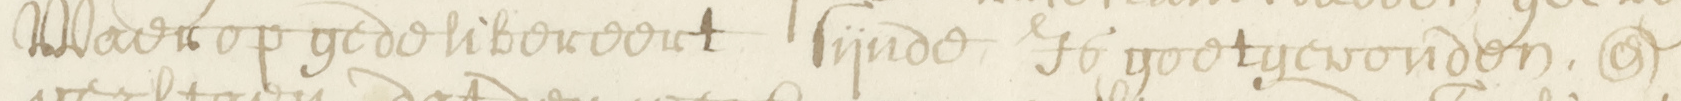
Waerop gedelibereert sijnde, Is goetgevonden, &
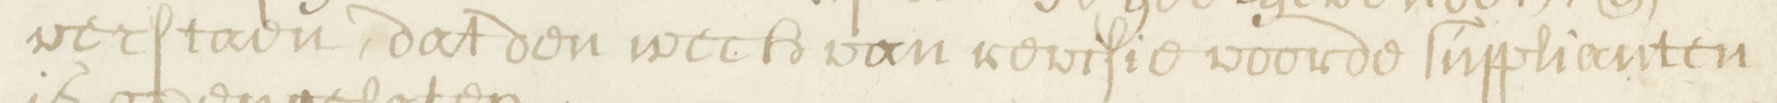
verstaen, dat den wech van revisie voorde supplianten
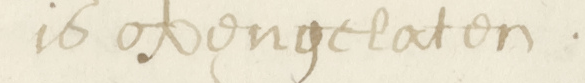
is opengelaten.
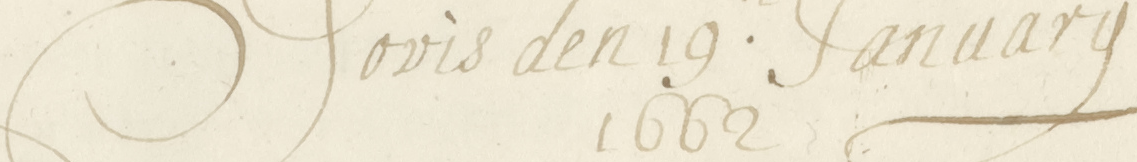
Doris den 19n . Januarij
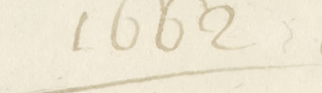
1662.
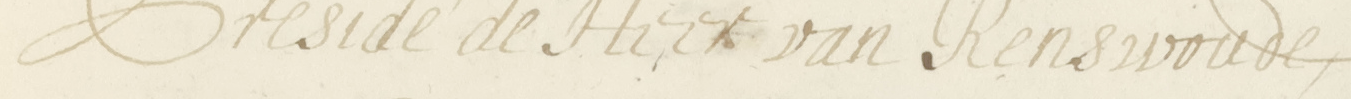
Preside de Heer van Renswoude,
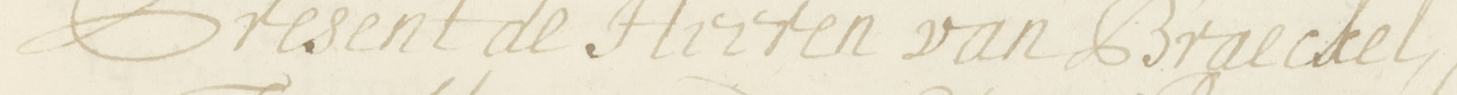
Present de Heeren van Braeckel,
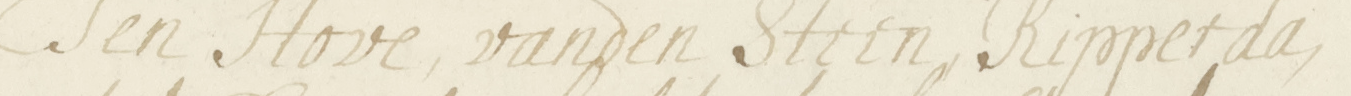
Ten Hove, vanden Steen, Ripperda,
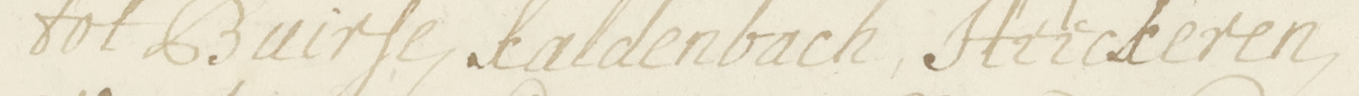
tot Buirse, Kaldenbach, Heeckeren,
